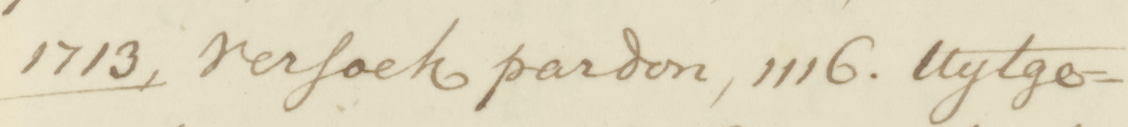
1713, Versoek pardon, 1116. Uytge„
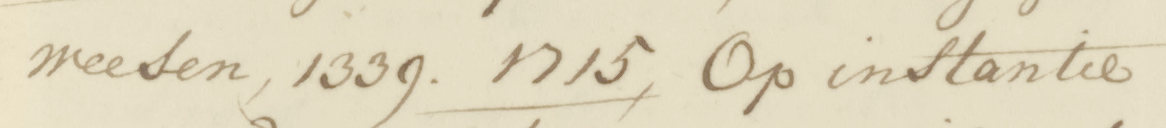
weesen, 1339. 1715, Op instantie
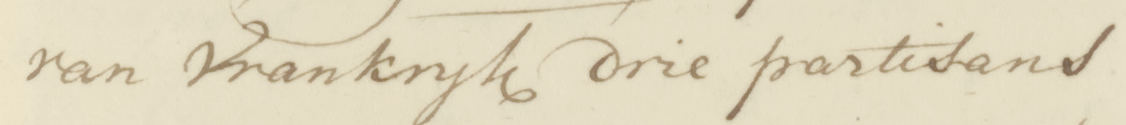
van Vrankrijk drie partisans
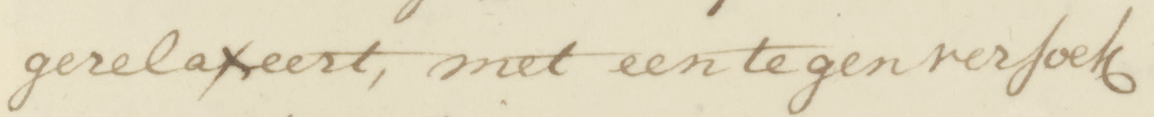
gerelaxeert, met een tegen versoek
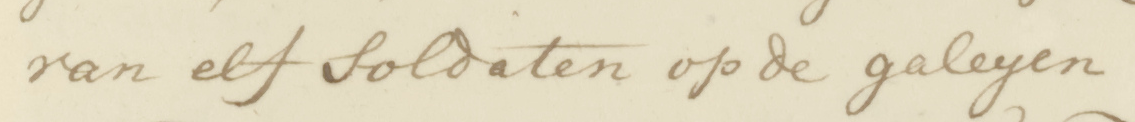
van elf soldaten op de galeyen
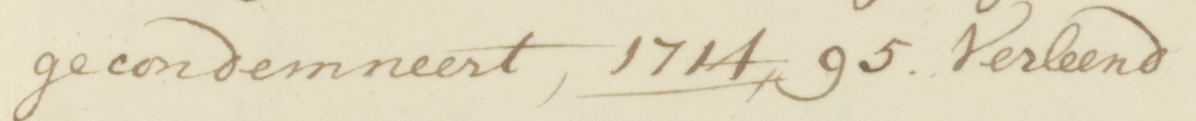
gecondemneert, 1714, 95. Verleend
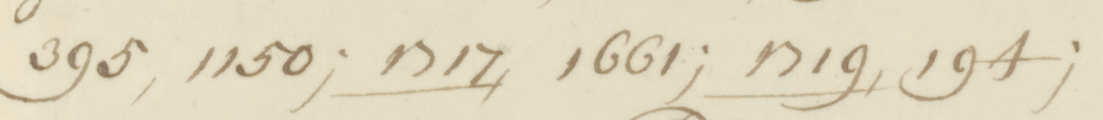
395. 1150; 1717, 1661; 1719, 194;
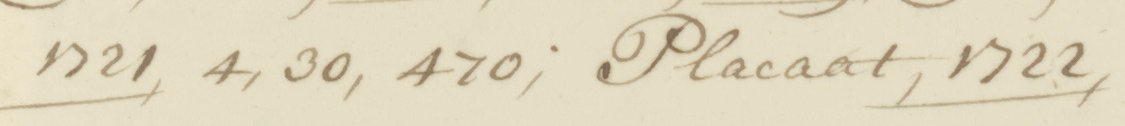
1721, 4, 30, 470; Placaat, 1722,
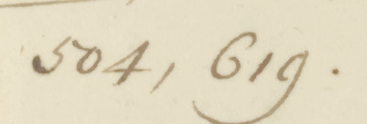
504, 619.
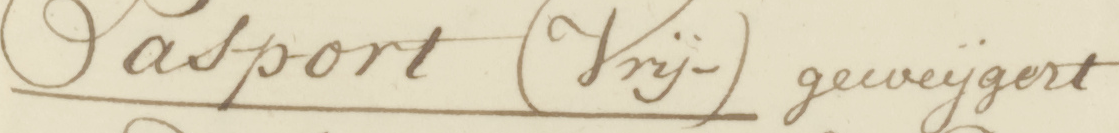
Paspoort (Vrij-) geweijgert
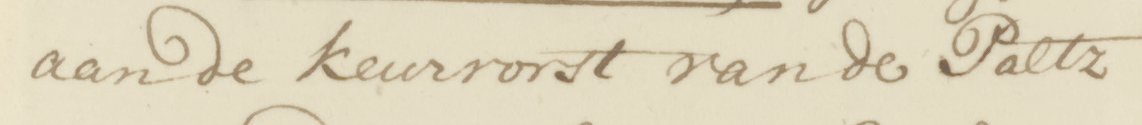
aan de keurvorst van de Paltz
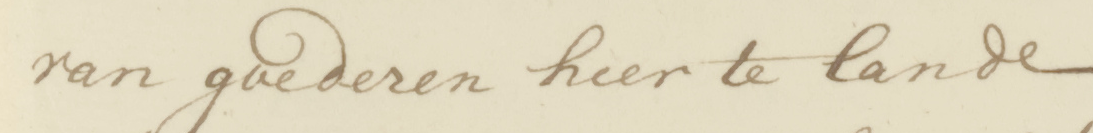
van goederen hier te lande
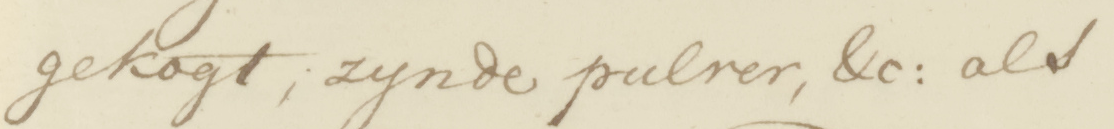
gekogt, zijnde pulver, &c; als
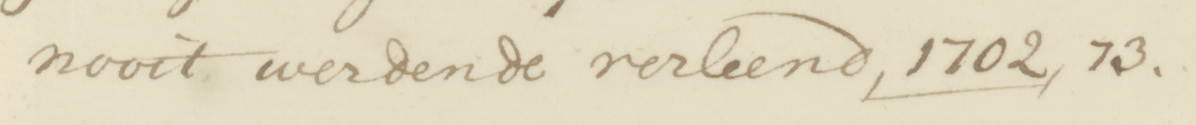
nooit werdende verleend, 1702, 73.
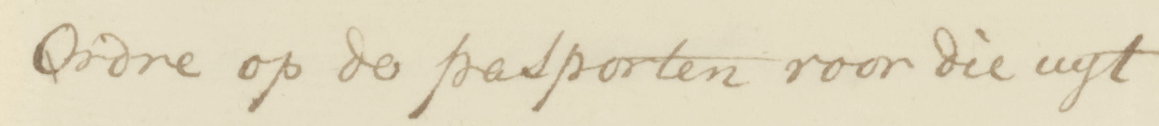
Ordre op de pasporten voor die uyt
